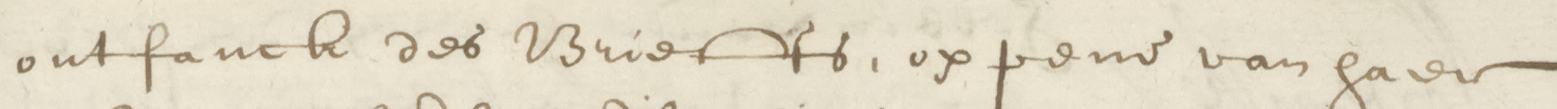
ontfanck des Brieffs, op pene van haer
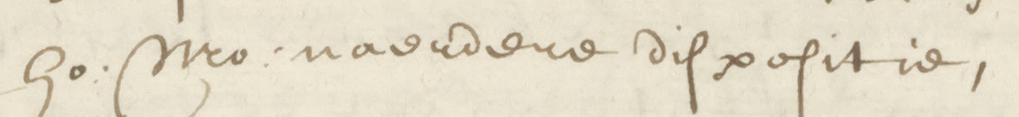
Ho:Mo: naerdere dispositie.
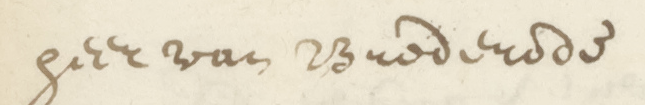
heer van Brederode
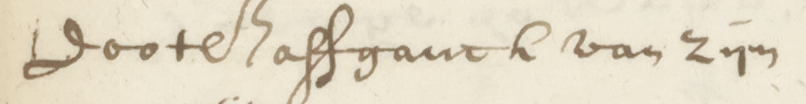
Dootl affganck van zijn
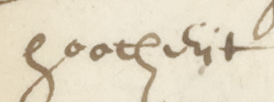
hoocheijt
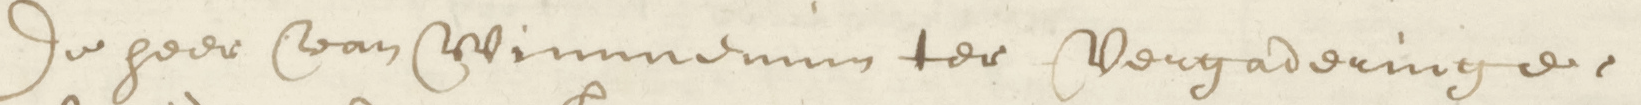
De heer van Wimmenum ter Vergaderinge,
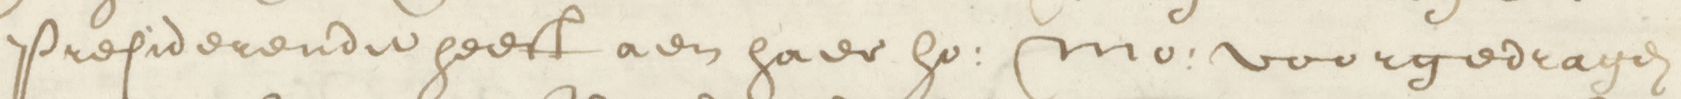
Presiderende heeft aen haer ho:Mo: voorgedragen
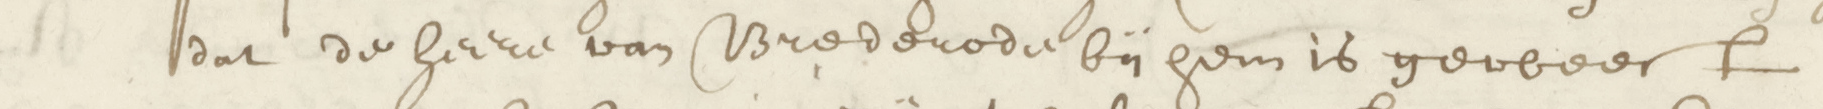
dat de heere van Brederode bij hem is geweest
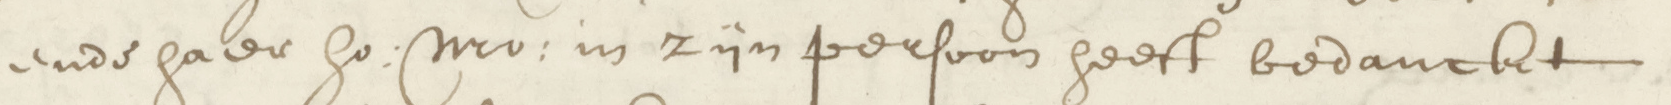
ende haer ho:Mo: in zijn persoon heeft bedanckt
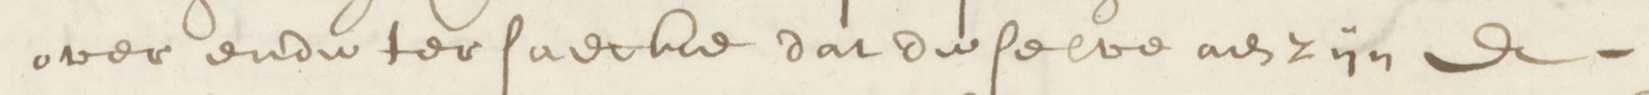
over ende ter saecke dat de selve aen zijn E
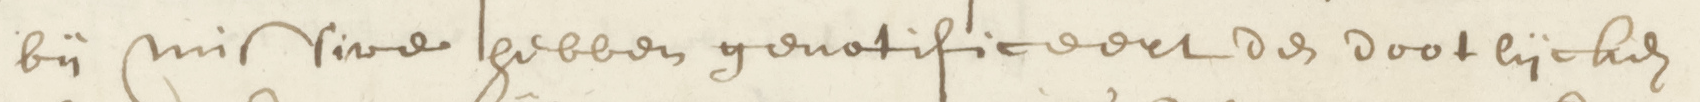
bij missive hebben genotificeert den dootlijcken
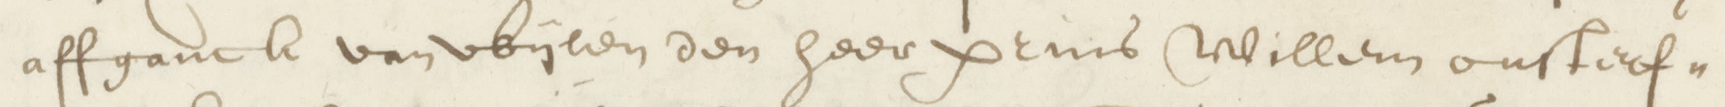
affganck van wijlen den heer Prins Willem onsterf„
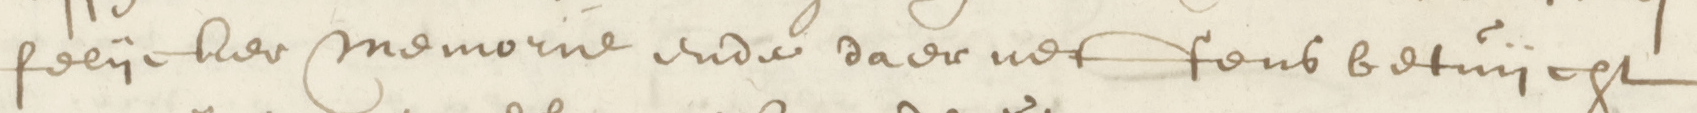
felijcker memorie ende daer neffens betuijcht
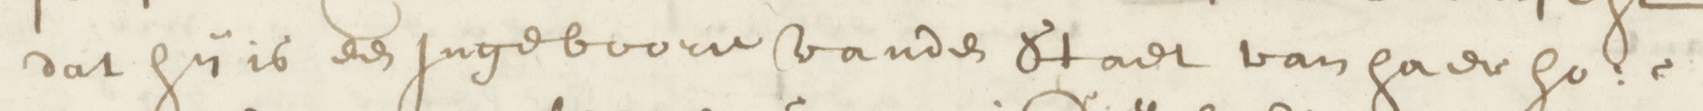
dat hij is een ingeboore vanden Staet van haer ho:
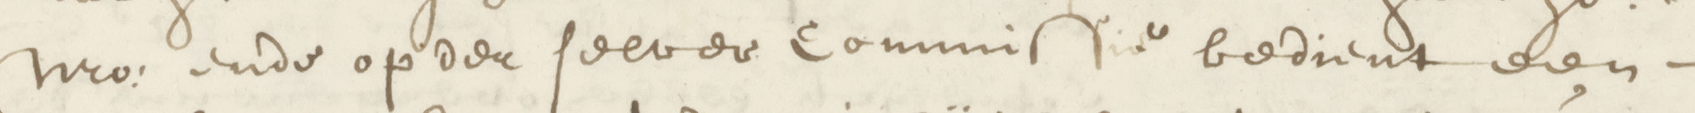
Mo: ende op der selver Commissie bedient een -
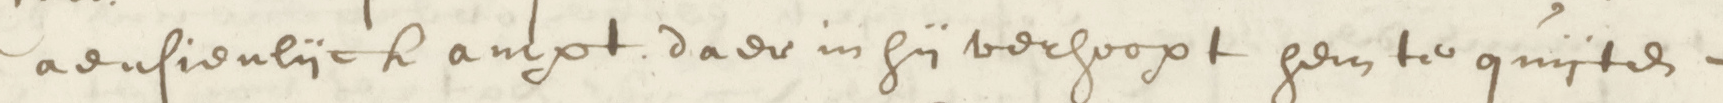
aensienlijck ampt daer in hij verhoopt hem te quijten
